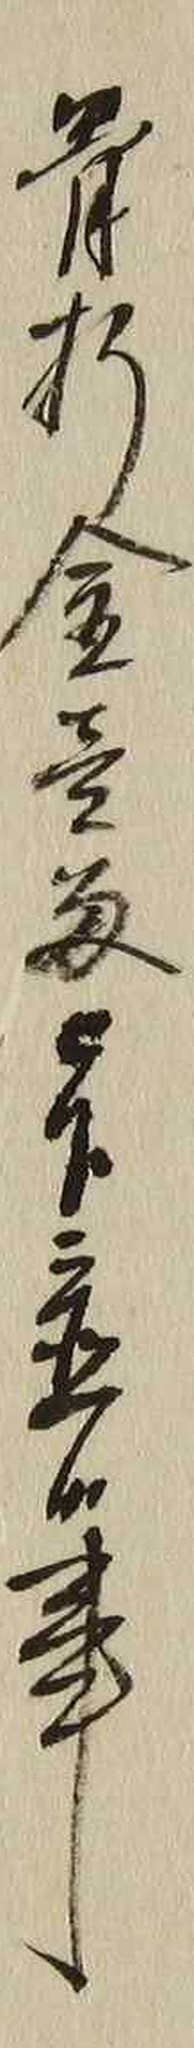骨折金壱両被下置候事
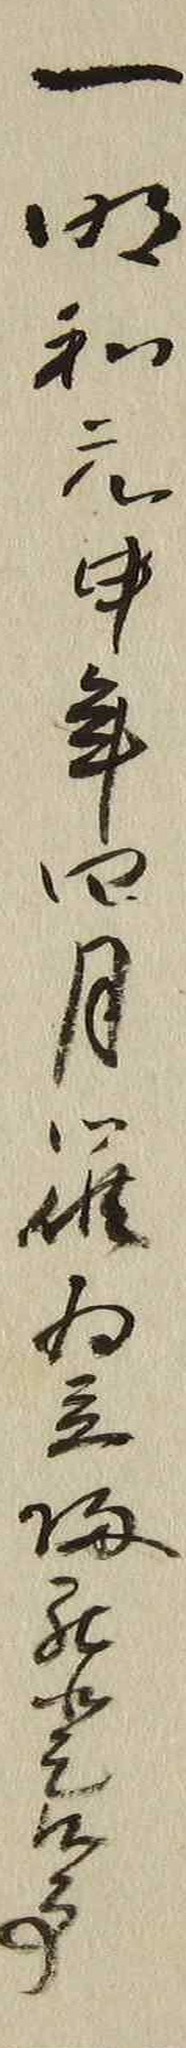一明和元申年四月御暇為立帰罷登候事
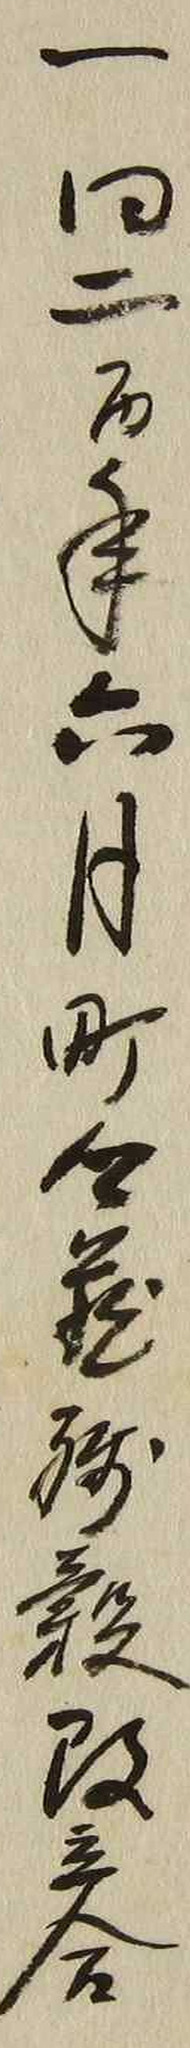一同二酉年六月町郷蔵残穀改立合
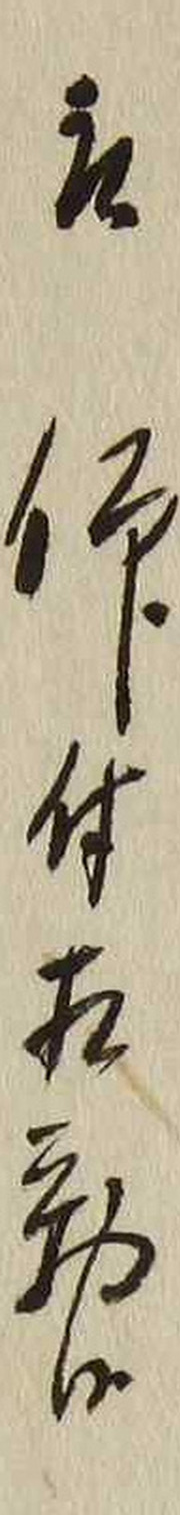被仰付相勤候
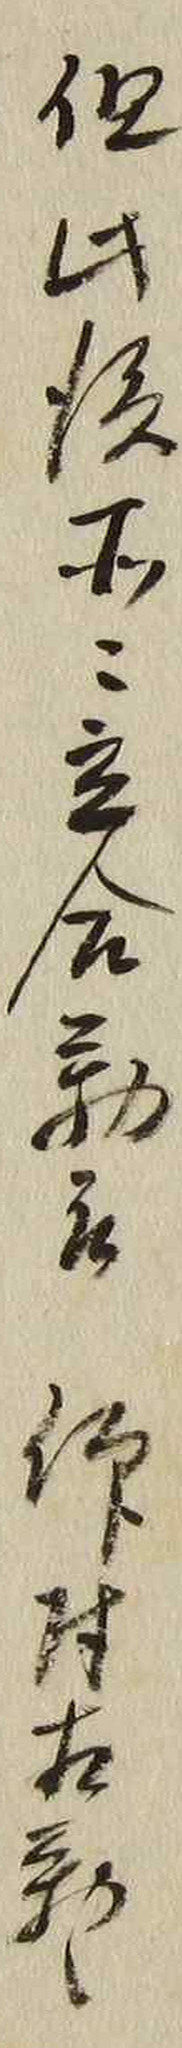但此後所々立合勤被仰付相勤候
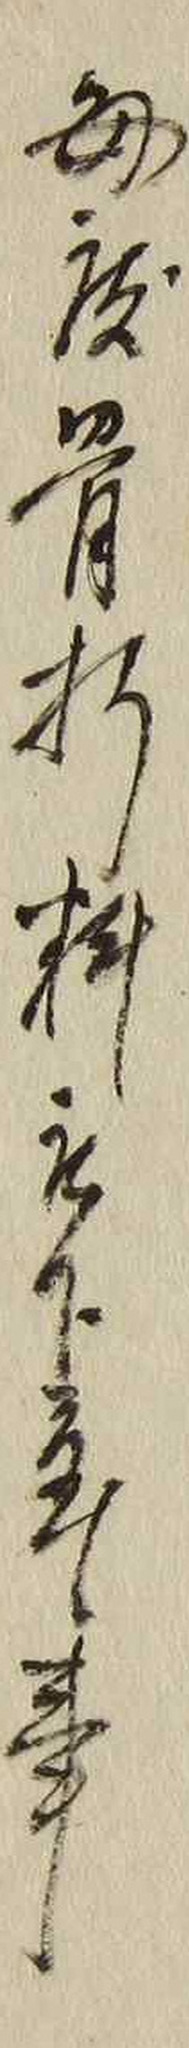毎度骨折料被下置候事
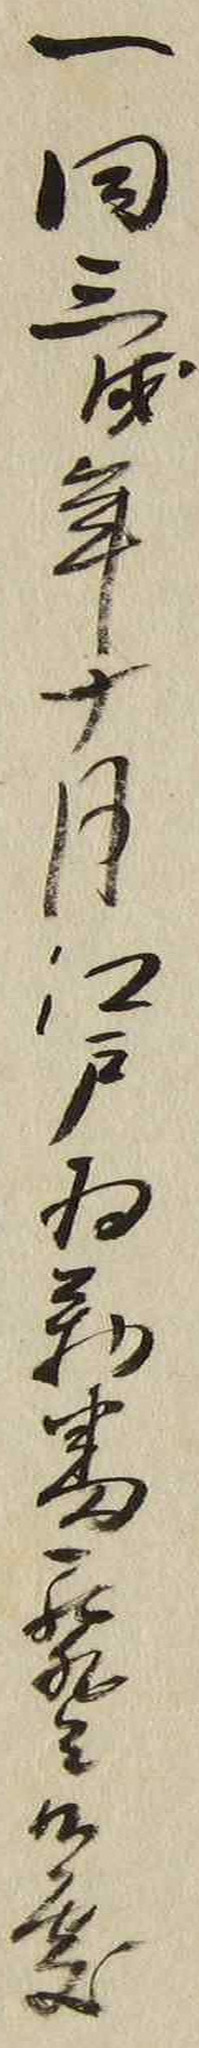一同三成年十月江戸為勤番罷登候処
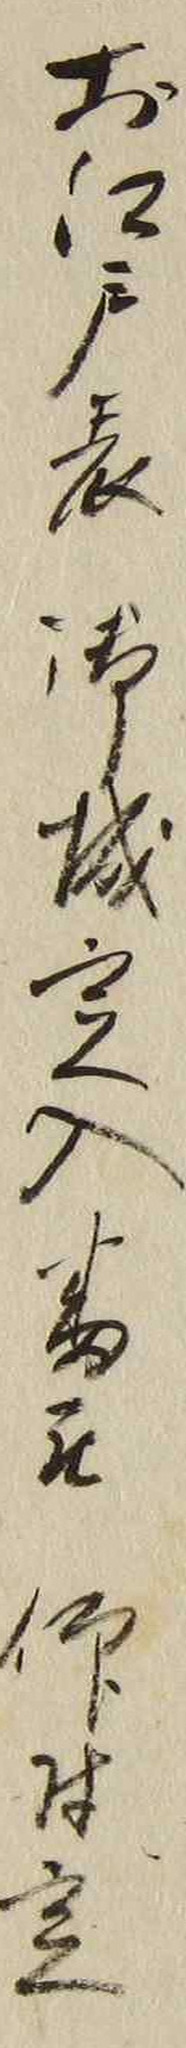於江戸表御城定入番被仰付定
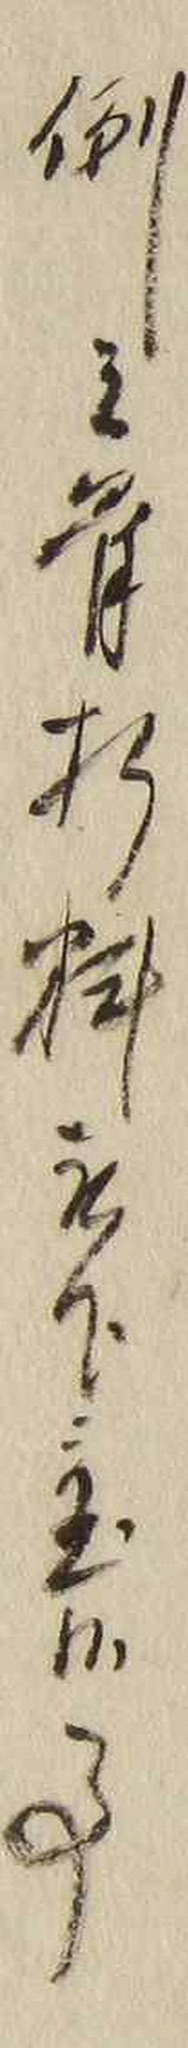例之骨折料被下置候事

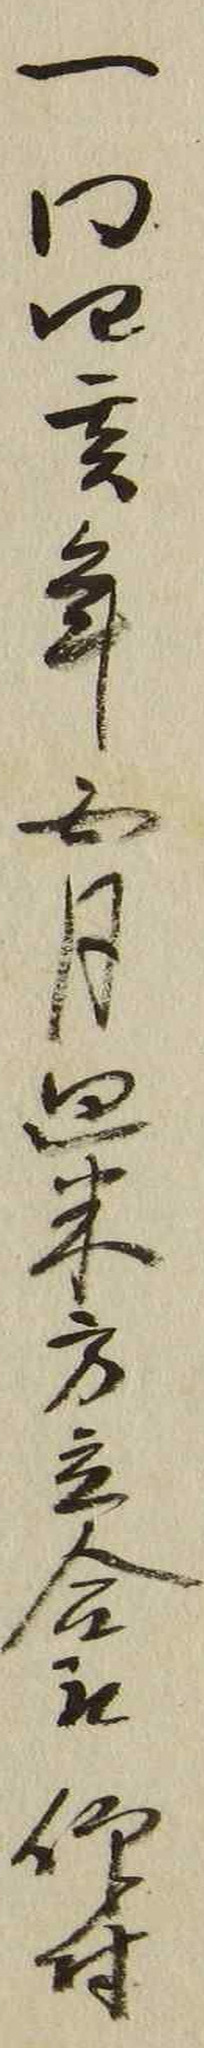一同四亥年五月廻米方立合被仰付
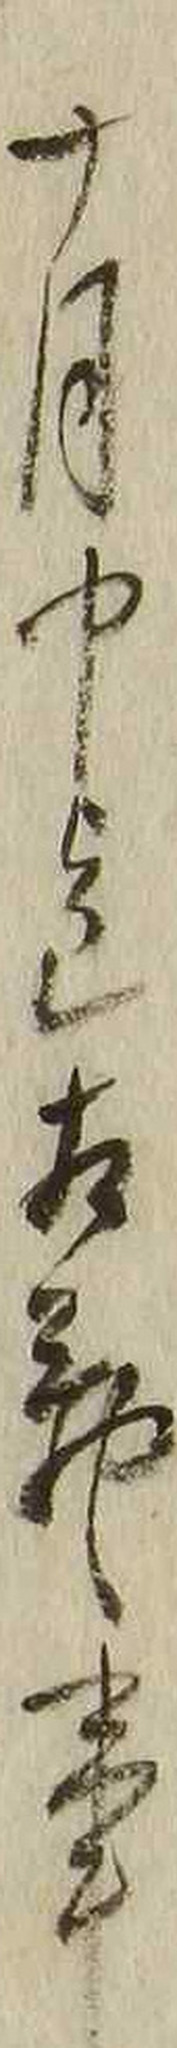十月中迄相勤候事
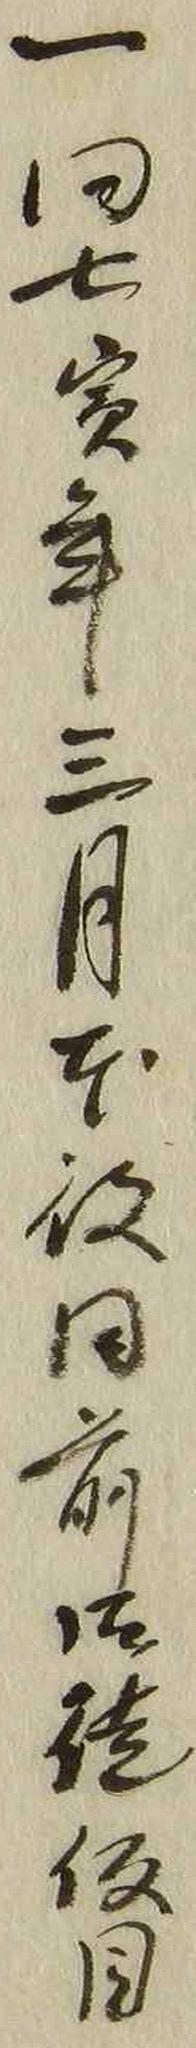一同七寅年三月本役同前御徒仮目
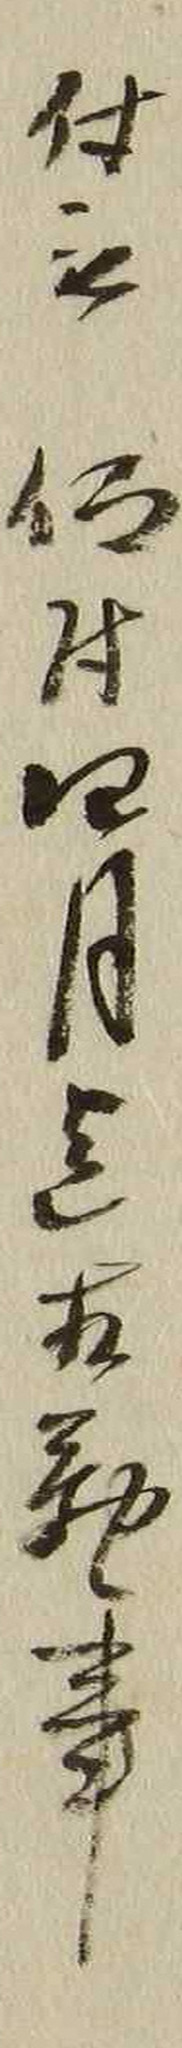付被仰付四月迄相勤候事
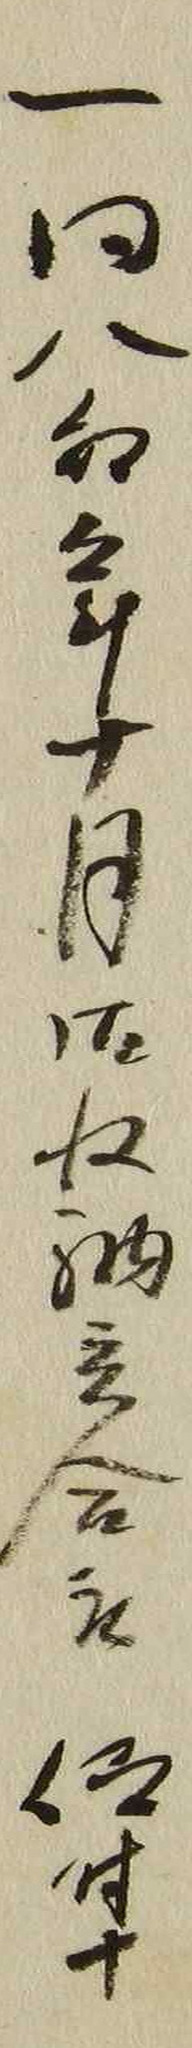一同八卯年十月御収納立合被仰付十
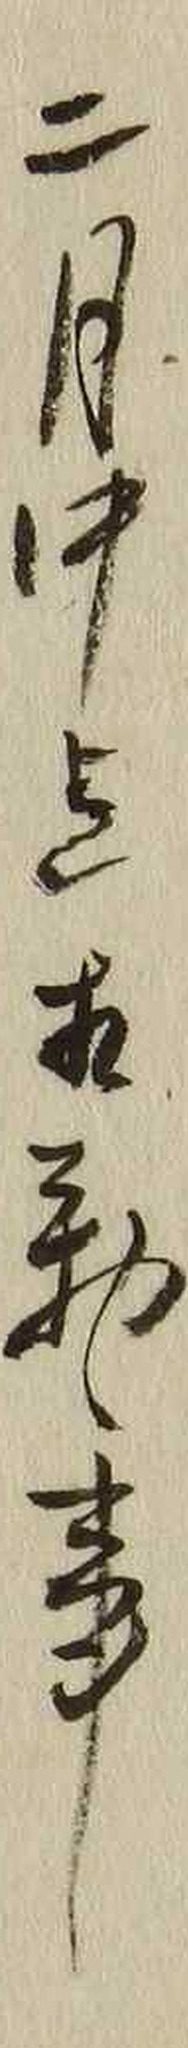二月中迄相勤候事
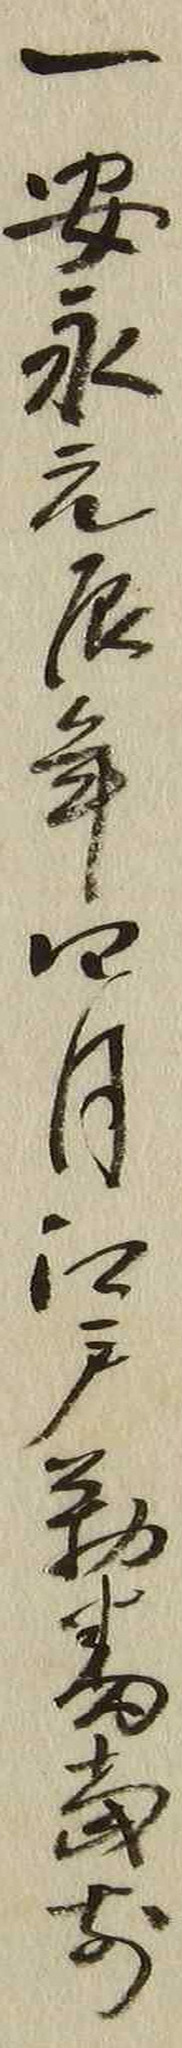一安永元辰年四月江戸勤番当前
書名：諸士系譜　巻之360　す之部10
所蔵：会津若松市立会津図書館
